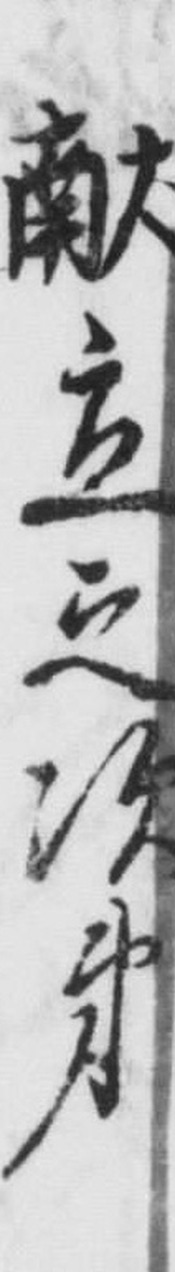献立之次第
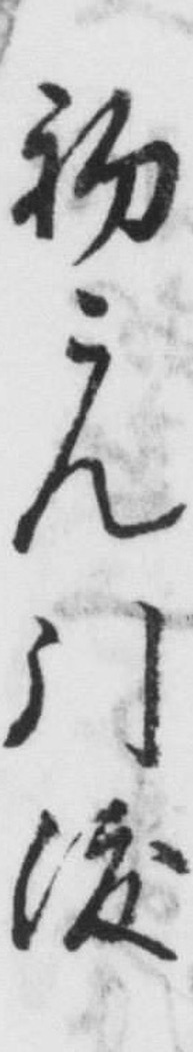初こん引後
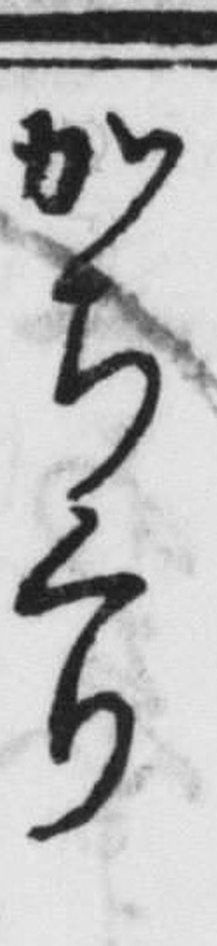かちくり
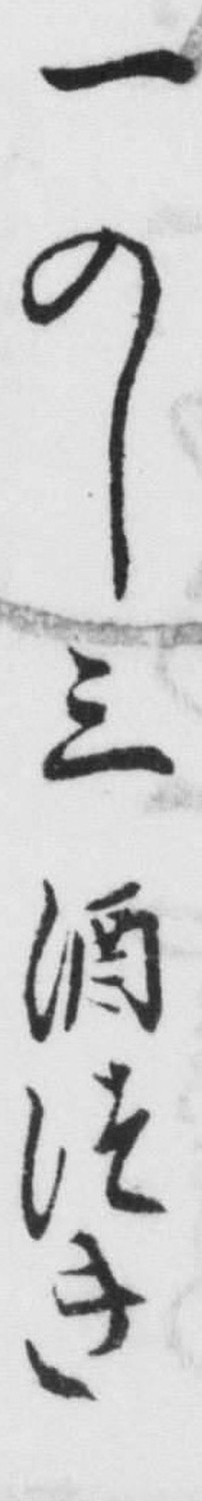一のし三酒つき
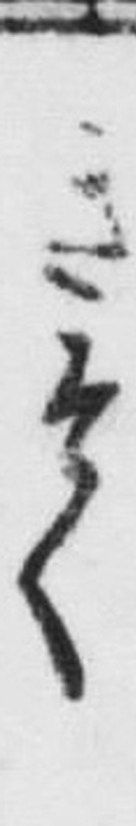きそく
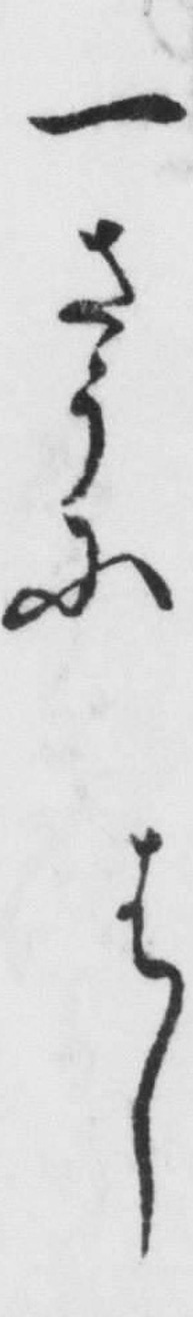一たうふはし
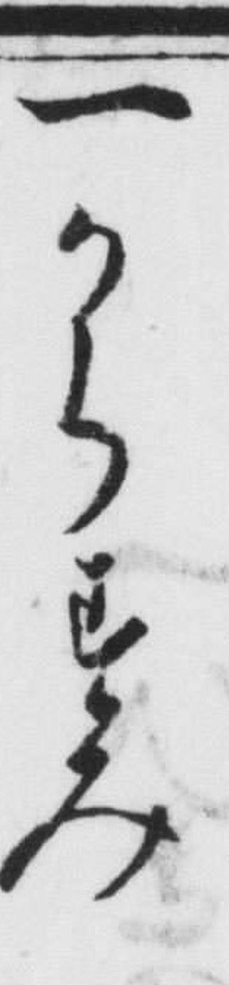一からすみ

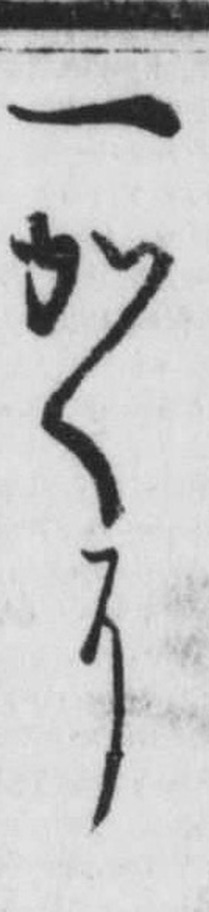一かくに
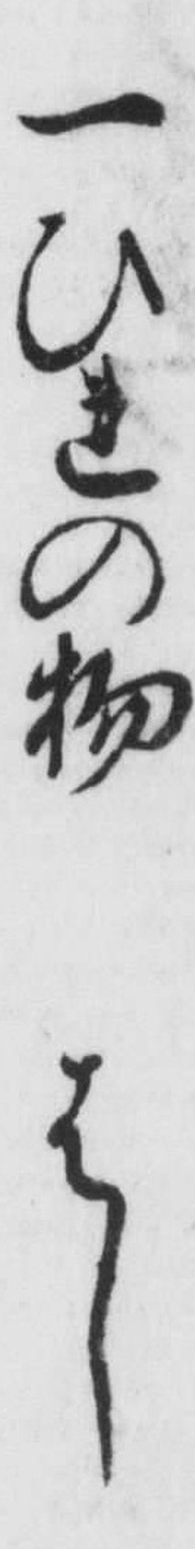一ひきの物はし
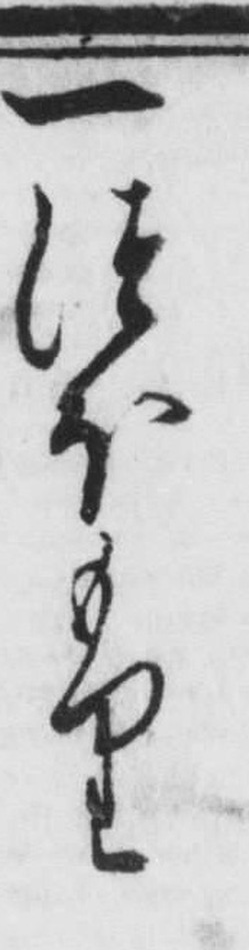一つほもの
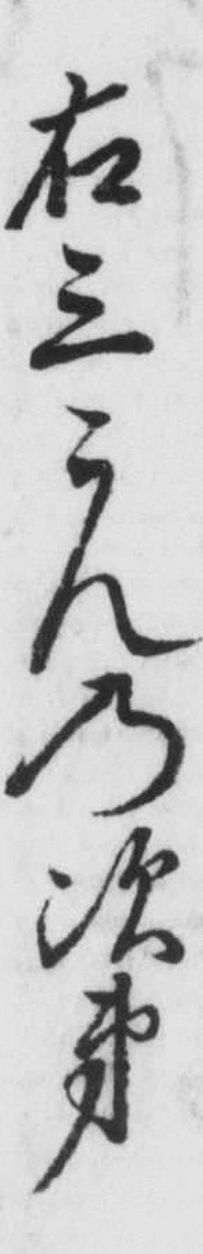右三こんの次第
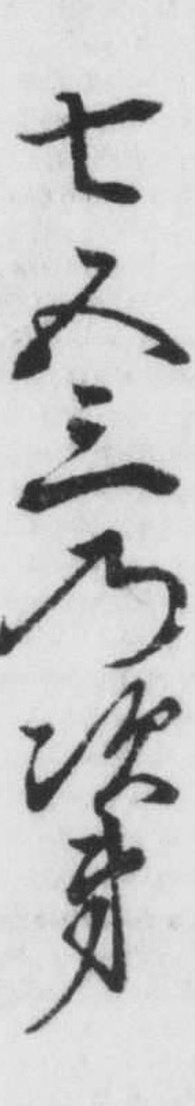七五三の次第
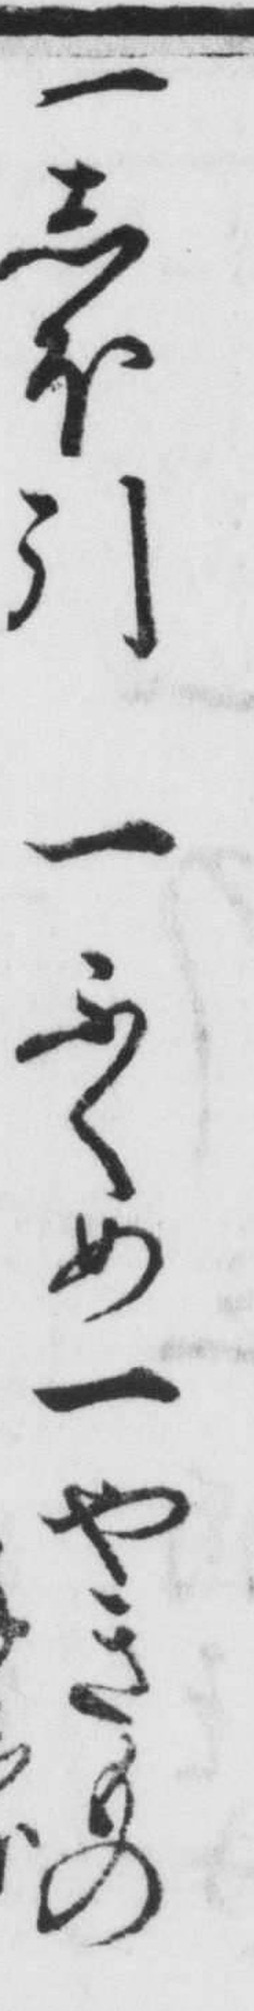一しほ引一ふくめ一やきもの
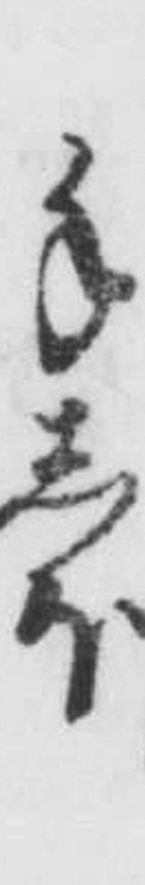ねしほ
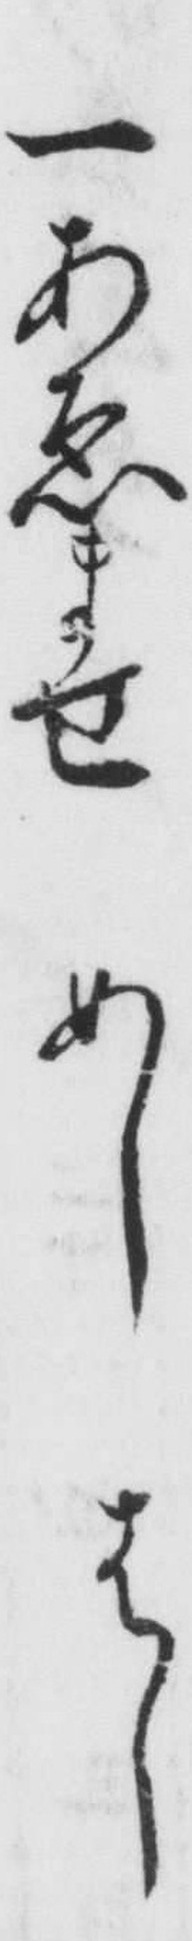一あゑませめしはし
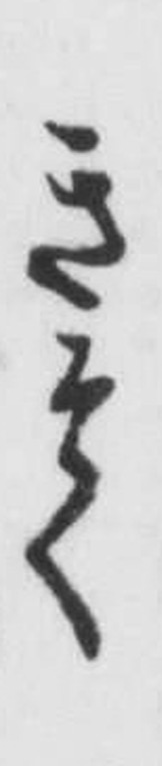きそく
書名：料理切形秘伝抄
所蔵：大阪府立大学学術情報センター 国文学研究資料館
